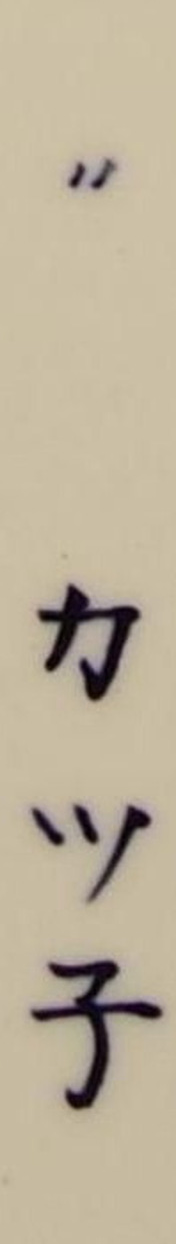カツ子
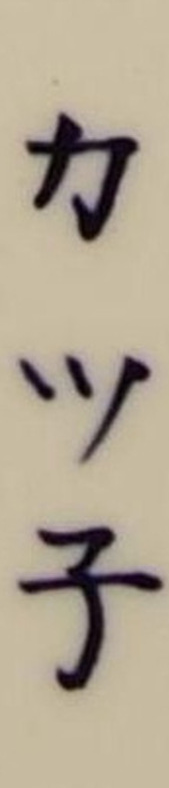カツ子
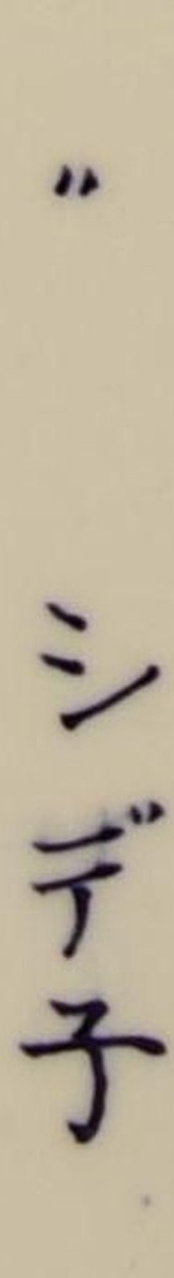シデ子
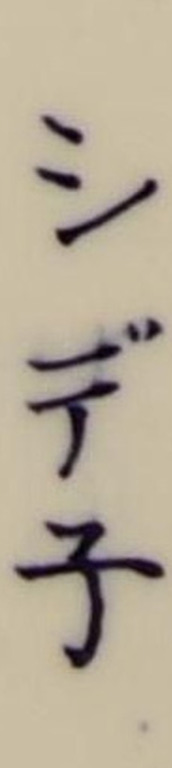シデ子
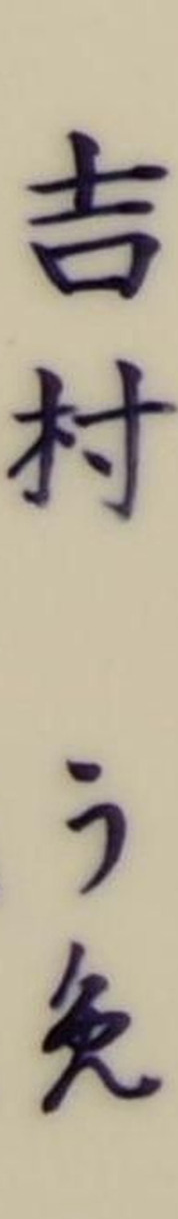吉村うめ
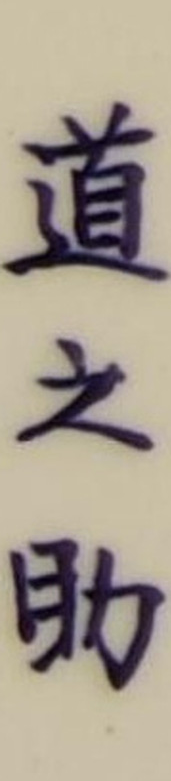道之助

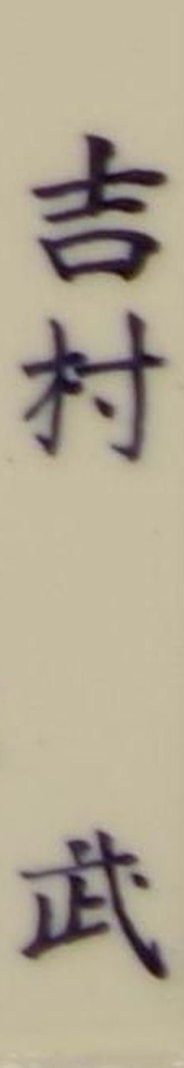吉村武
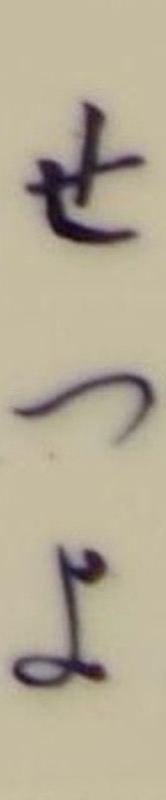せつよ
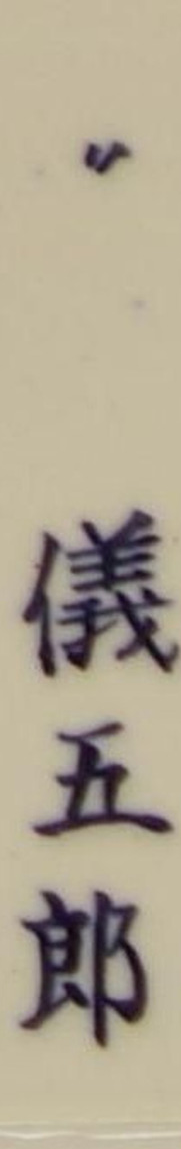儀五郎
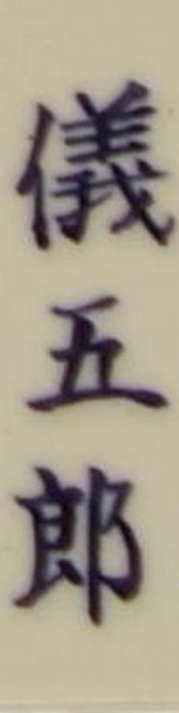儀五郎
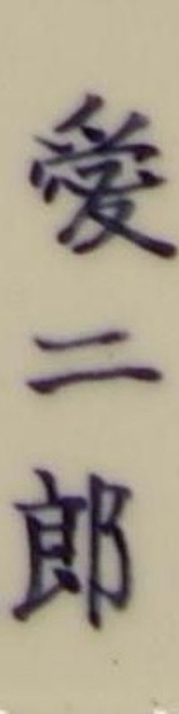愛二郎
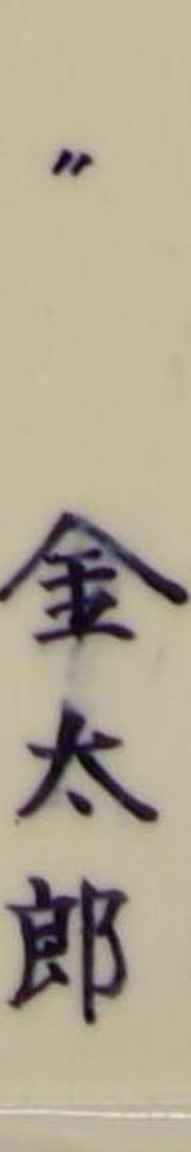金太郎
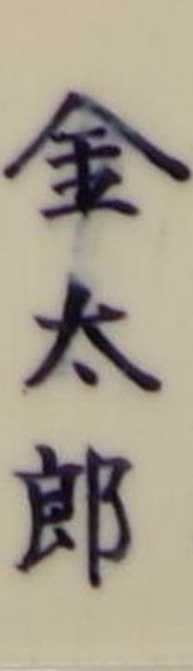金太郎
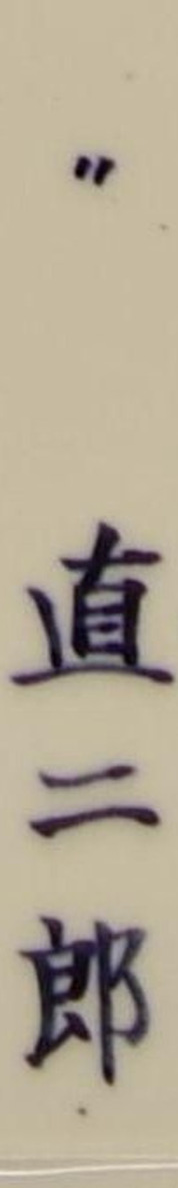直二郎
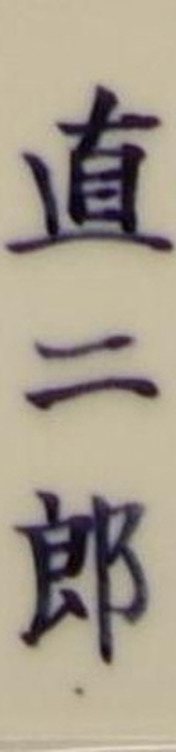直二郎
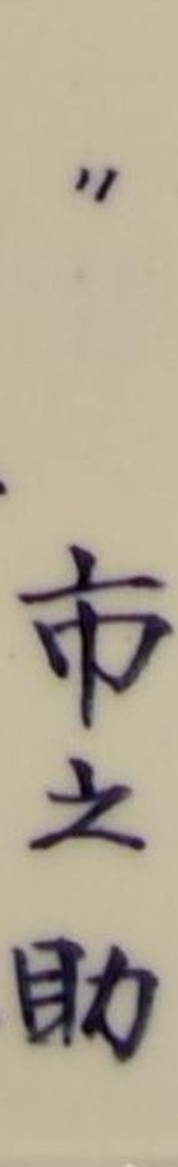市之助
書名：A~D
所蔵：koyasan kongobuji
